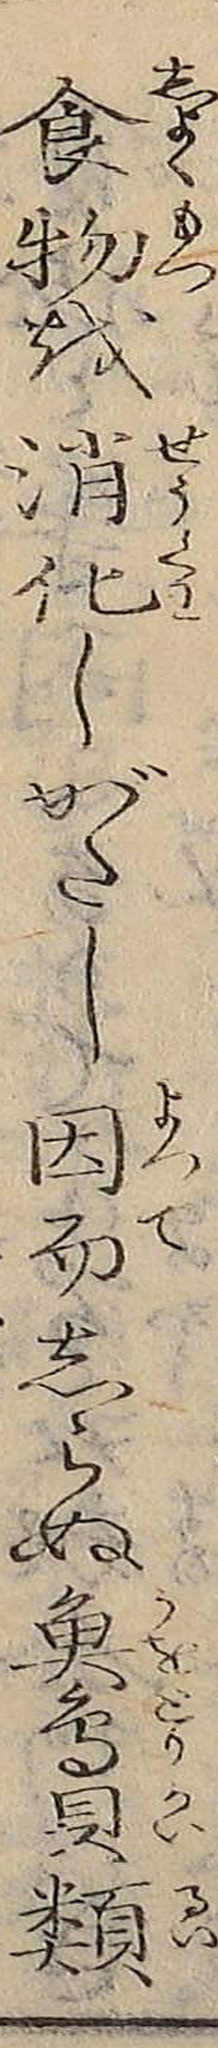食物を消化しがたし因而しらぬ魚鳥貝類
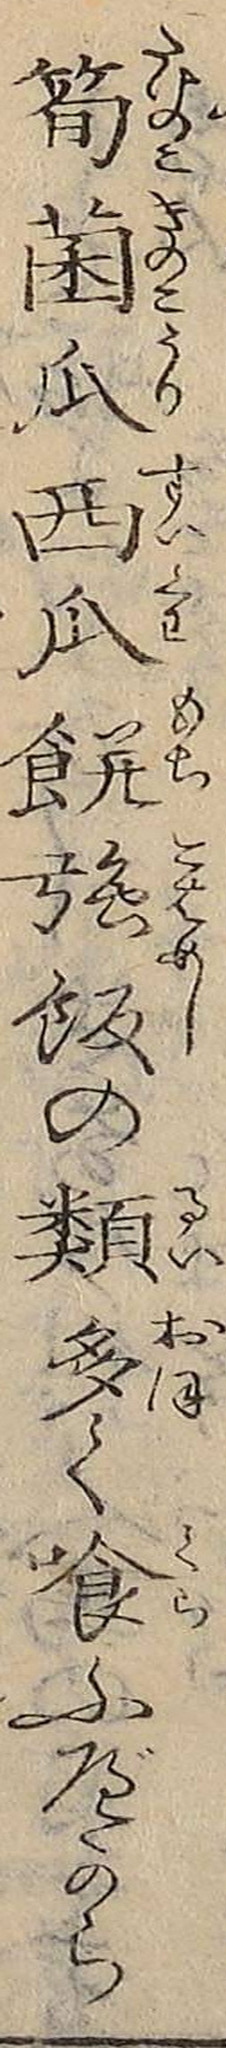筍菌瓜西瓜餅強飯の類多く喰ふべから
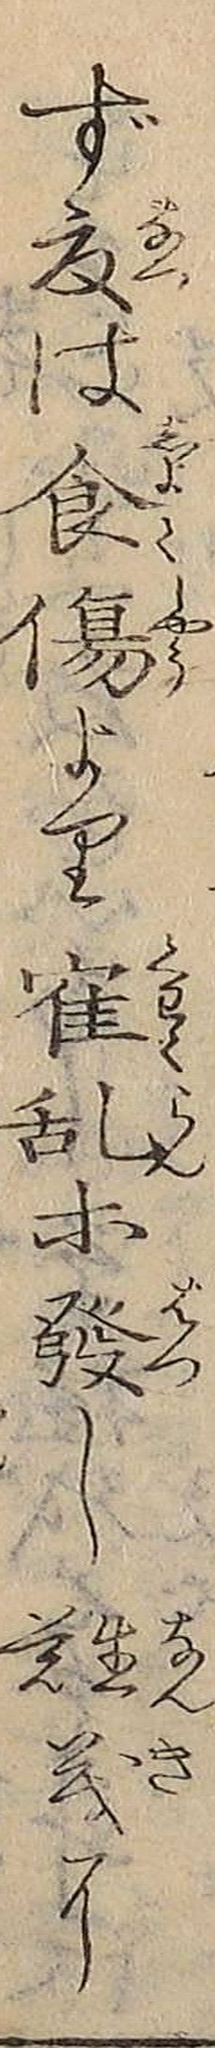ず夏は食傷より寉乱等発し難義に
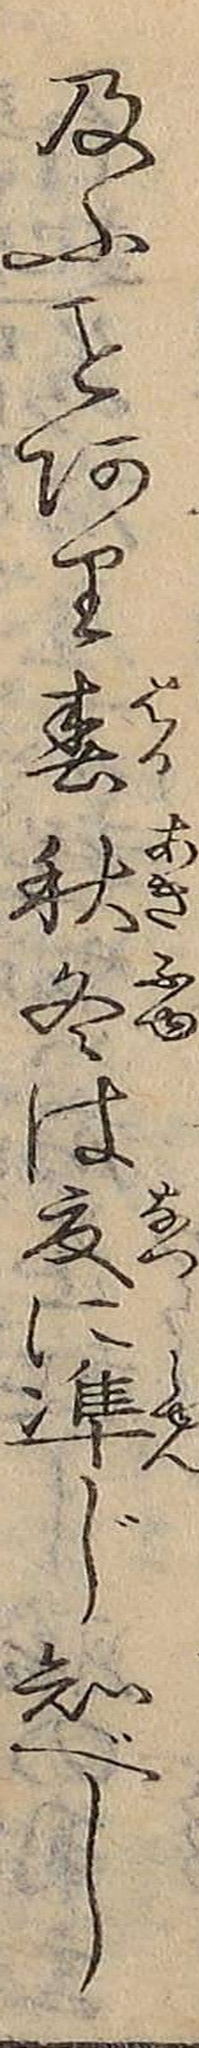及ふことあり春秋冬は夏に準じ知べし
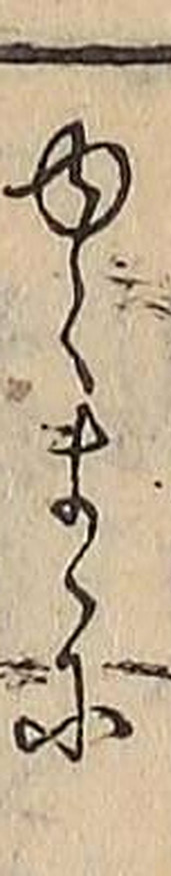ゆくまゝに
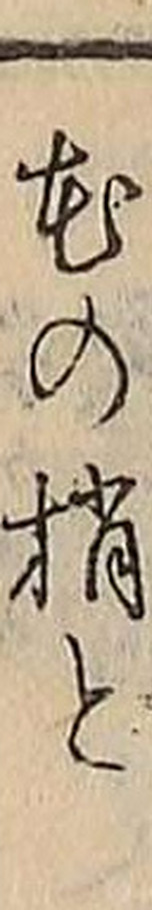花の梢と
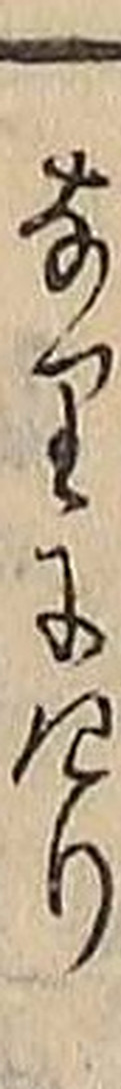なりにけり
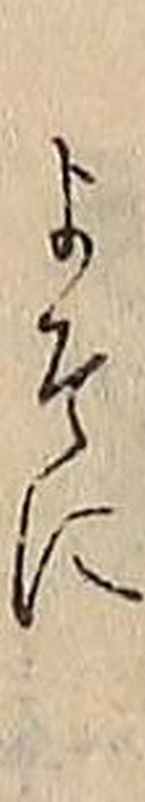よそに
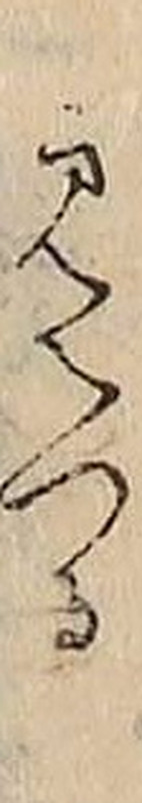見くつる
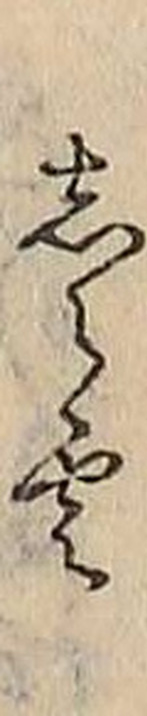しら雲

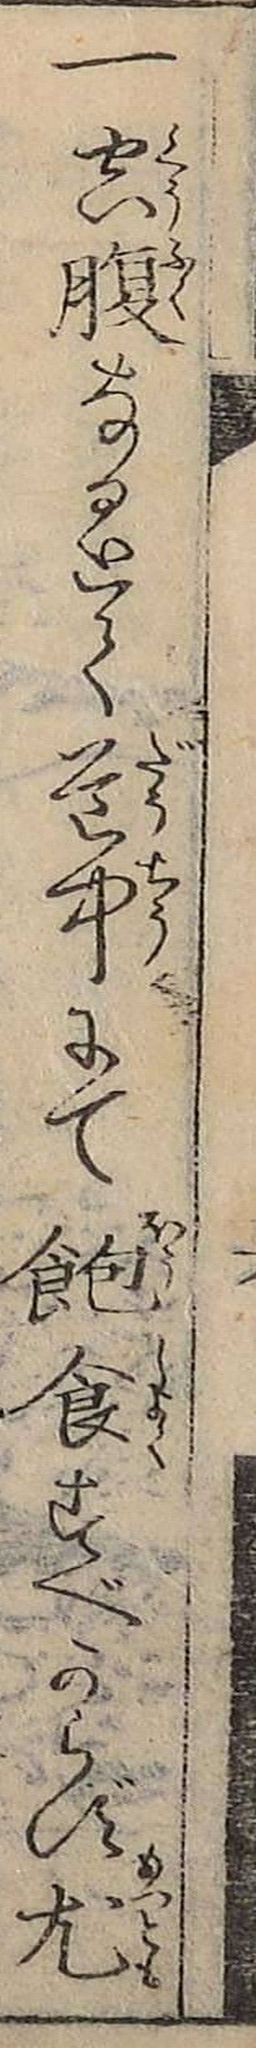一空腹なるとて道中にて飽食すべからず尤
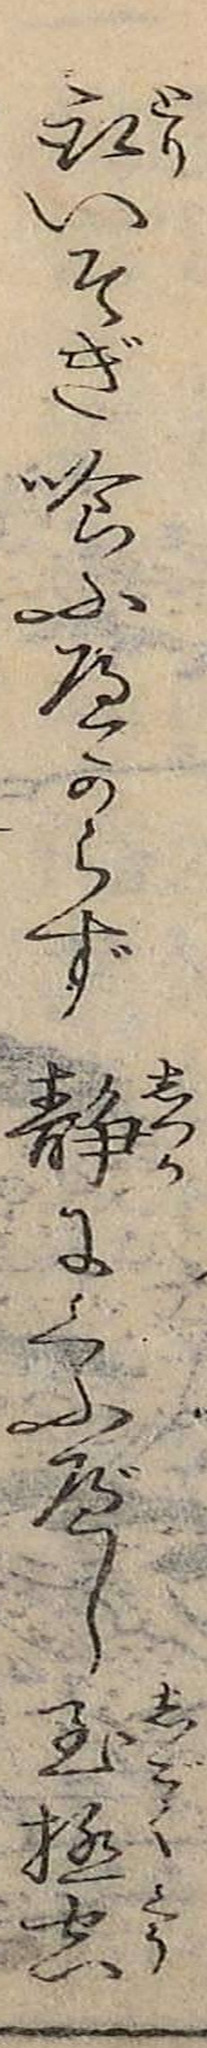取いそぎ喰ふへからず静にくふべし至極空
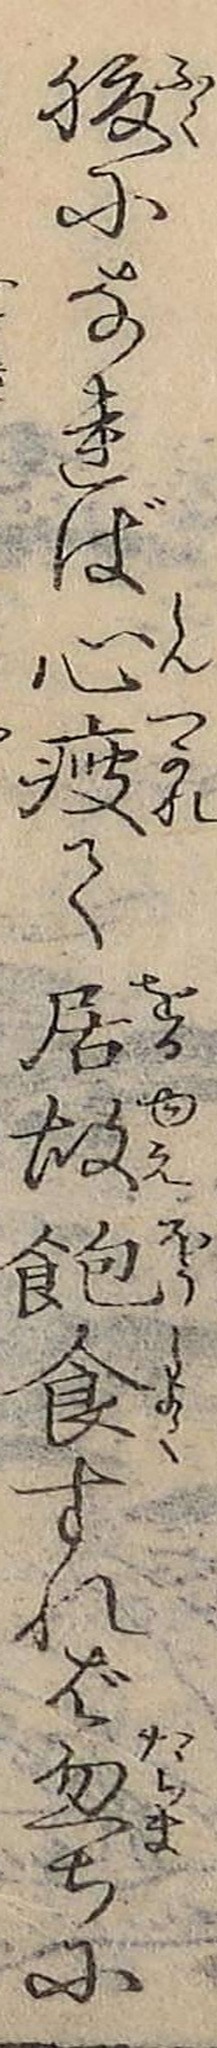腹になれば心疲て居故飽食すれば忽ちに
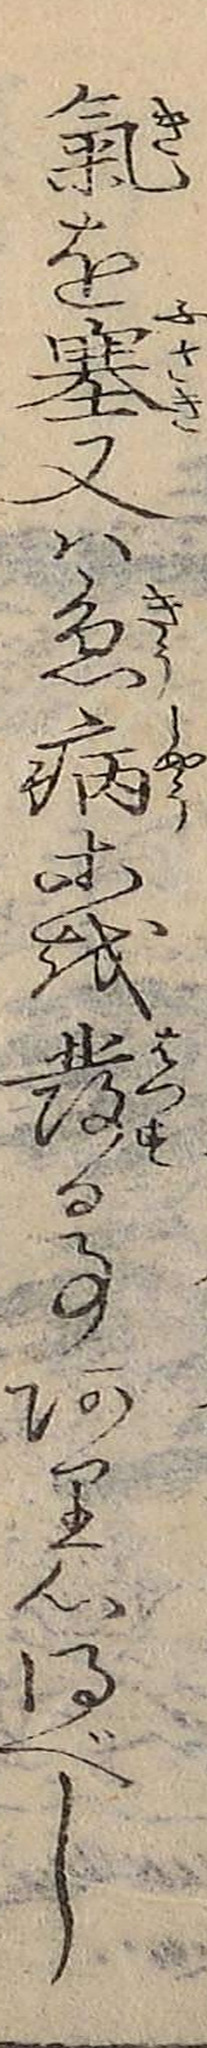気を塞又は急病等を発る事あり心得べし
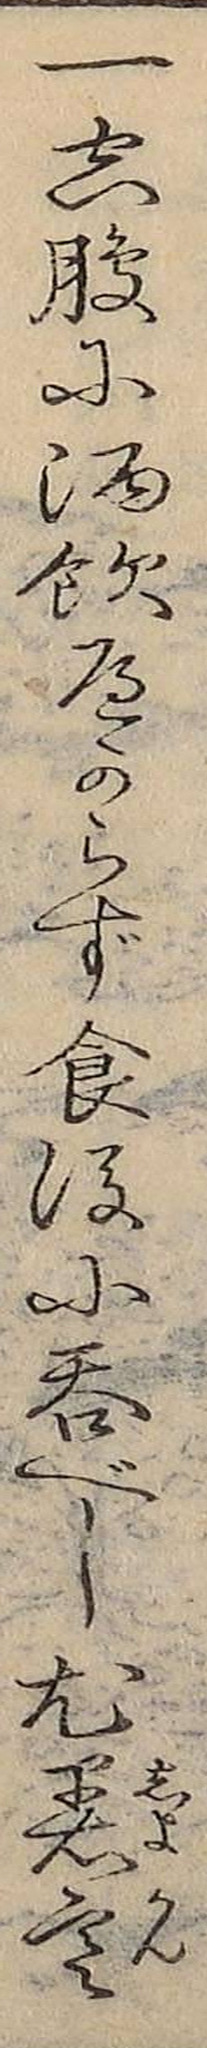一空腹に酒飲へからず食後に呑べし尤暑寒
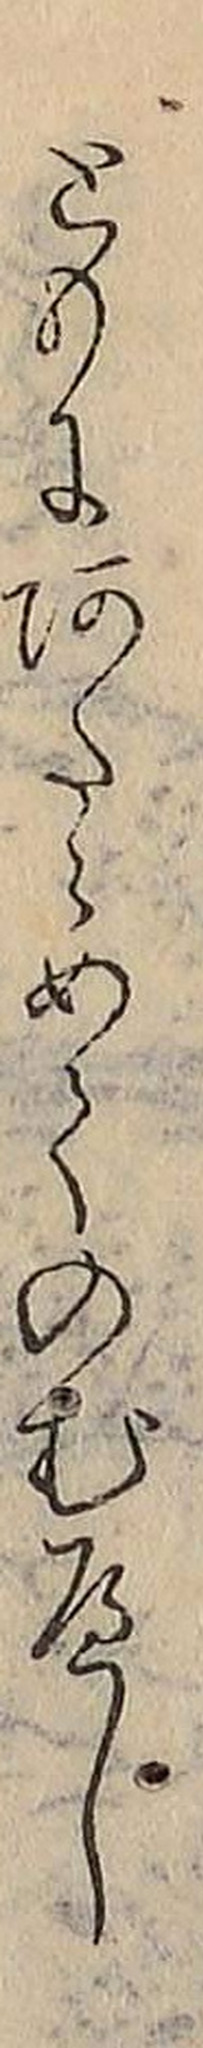ともにあたゝめてのむへし
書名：旅行用心集
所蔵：神戸大学附属図書館 国文学研究資料館
